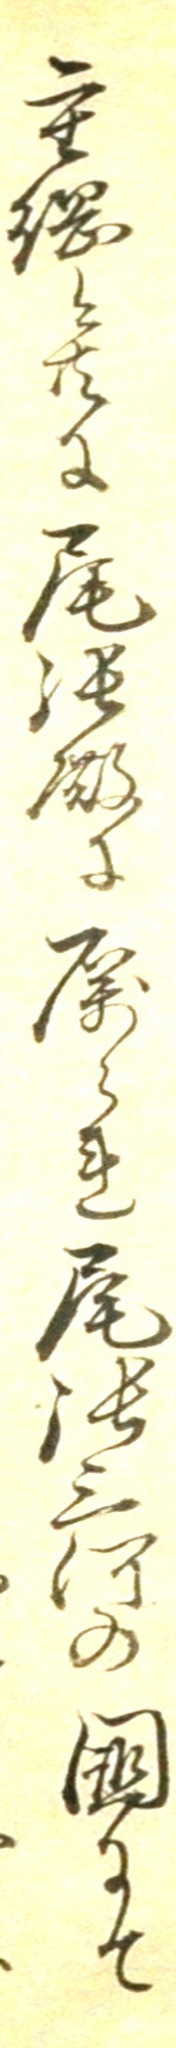重綱と共に尾張殿に属られ尾張三河の国にて
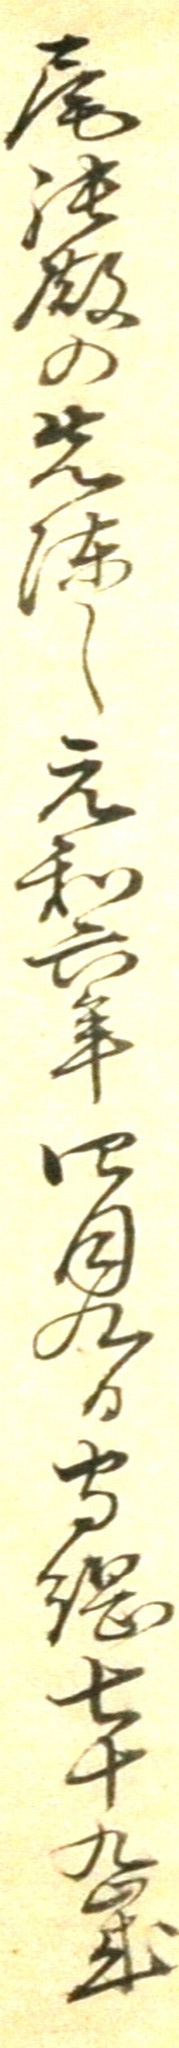尾張殿の先陣し元和六年四月九日守綱七十九歳
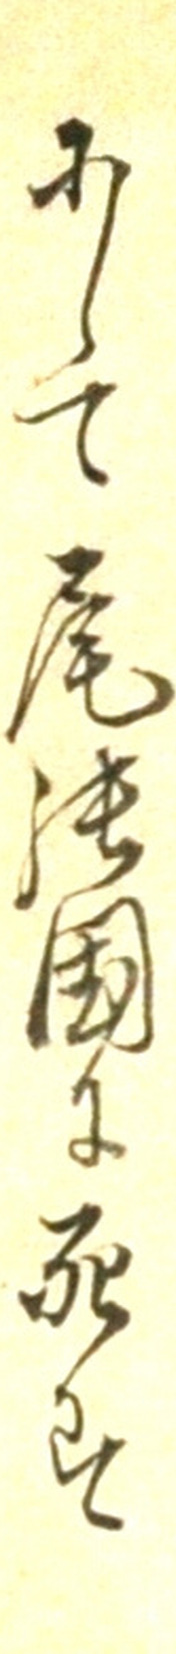にして尾張国に死す
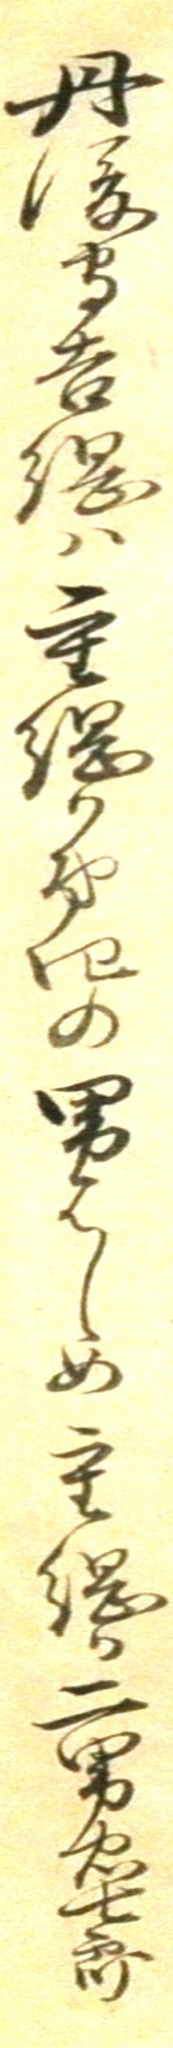丹後守吉綱は重綱か第四の男はしめ重綱か二男忠七郎
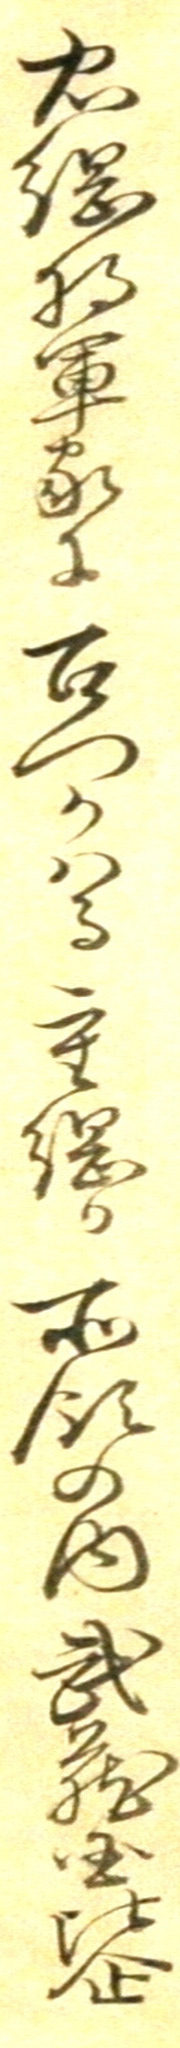忠綱将軍家に召つかはる重綱か所領の内武蔵国比企
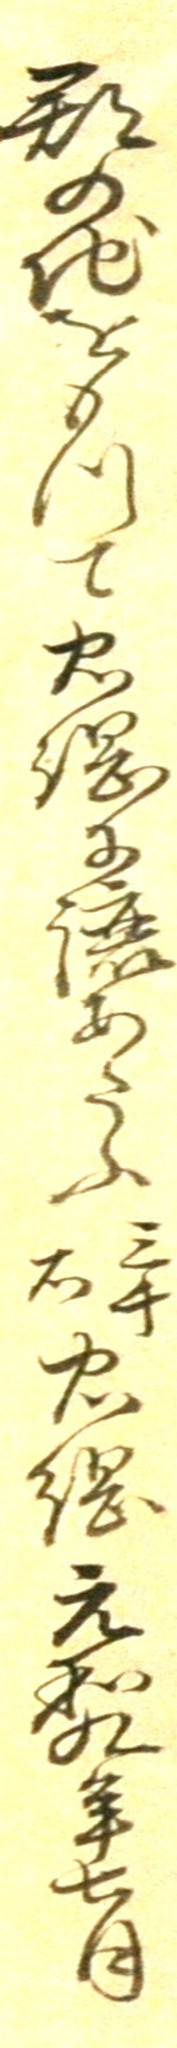郡の地をもつて忠綱に譲あたふ三千石忠綱元和九年七月

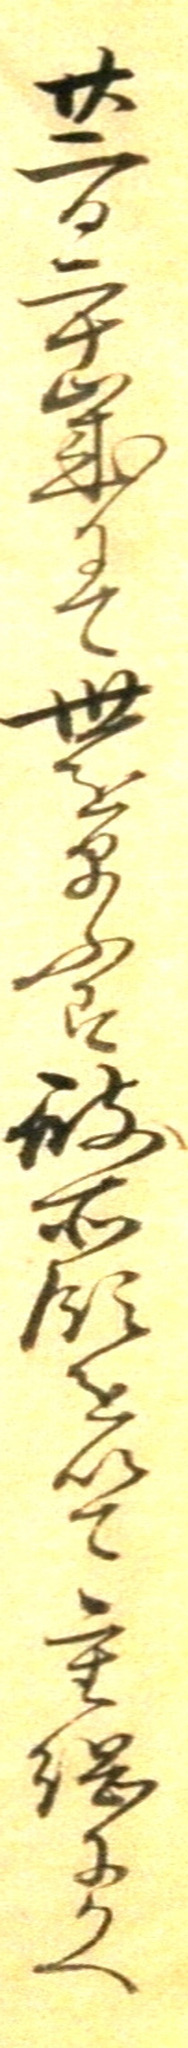廿二日二十歳にて世を早ふす彼所領を以て重綱にかへ
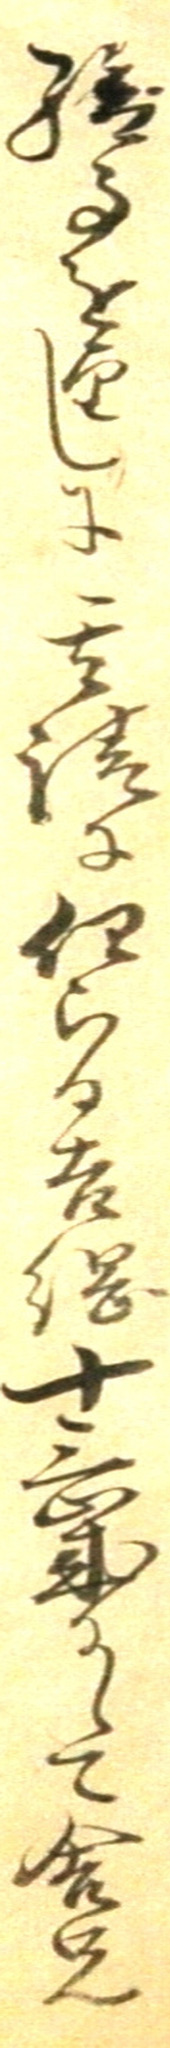給事を望しに其請に任らる吉綱十三歳にして舎兄
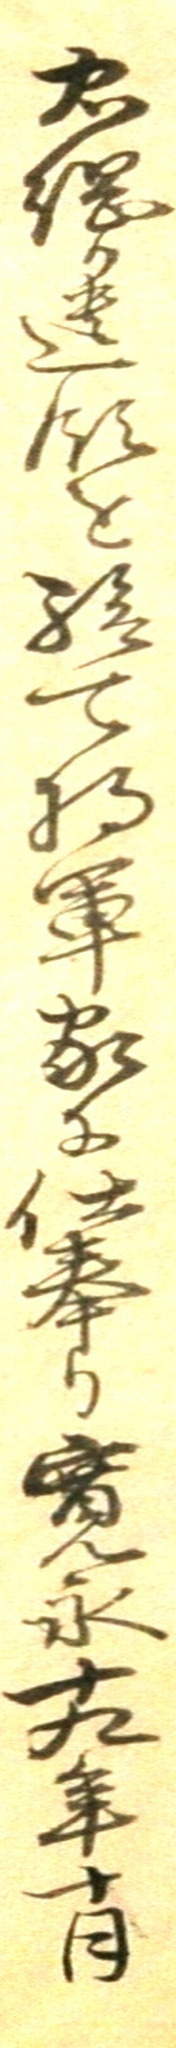忠綱か遺領を給て将軍家に仕奉り寛永十九年十月
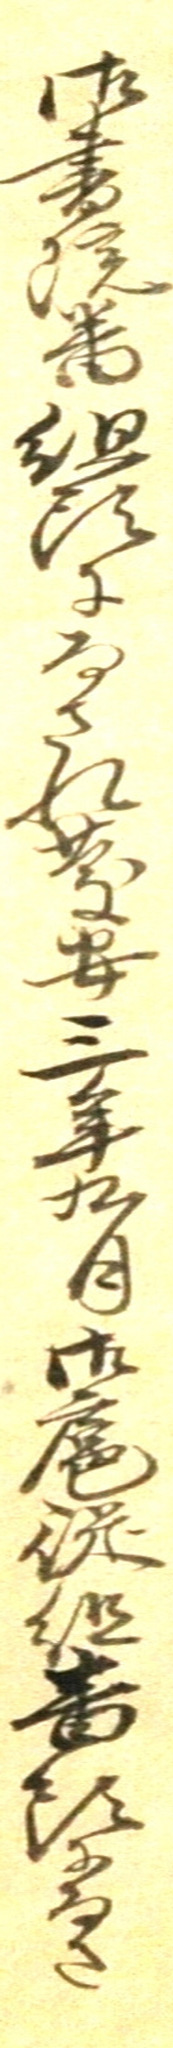御書院番組頭になされ慶安三年九月御扈従組番頭になさ
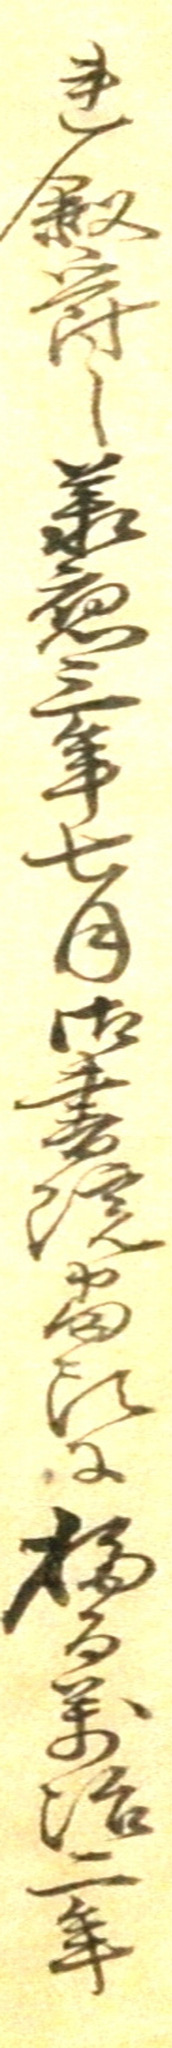れ叙爵し承応三年七月御書院番頭に移る万治二年
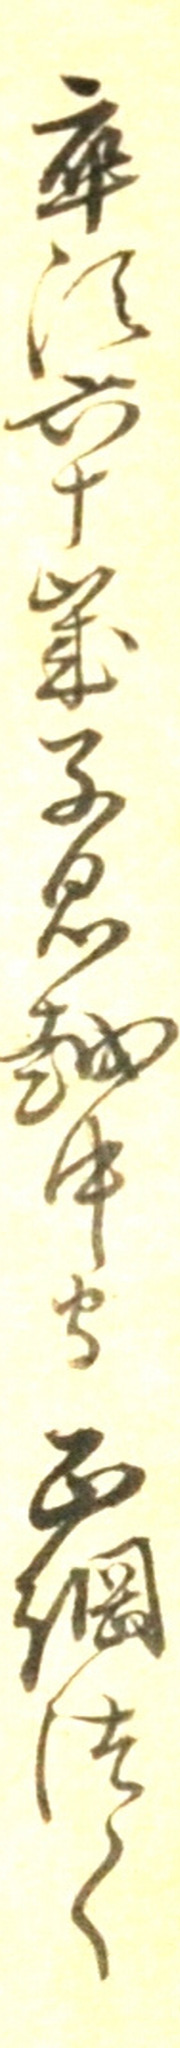卒す六十歳子息越中守正綱つく
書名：藩翰譜（四・中）
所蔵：伊那市立高遠町図書館・合同会社AMANE
